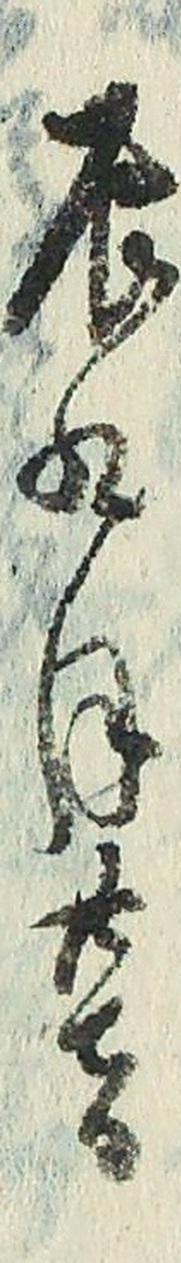辰九月廿七日
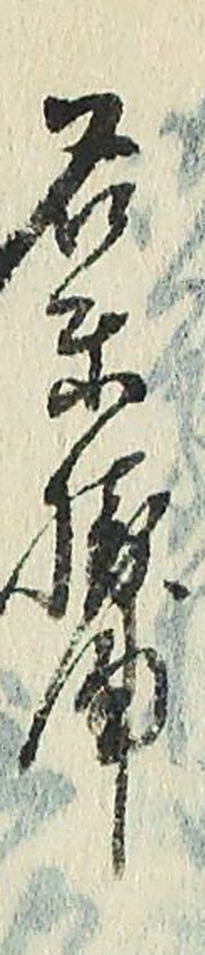名東勝浦
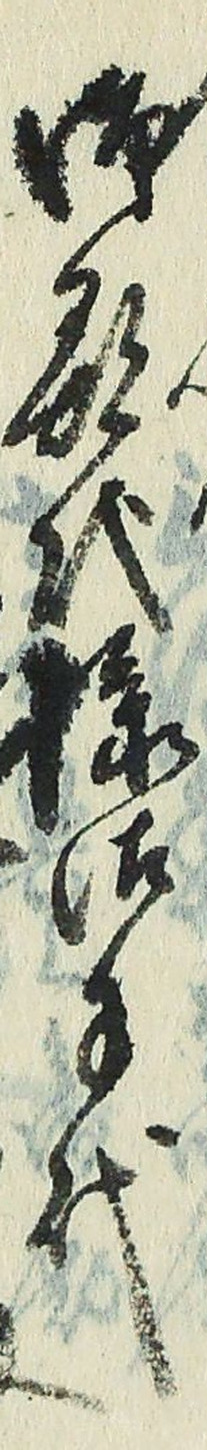御郡代様御手代
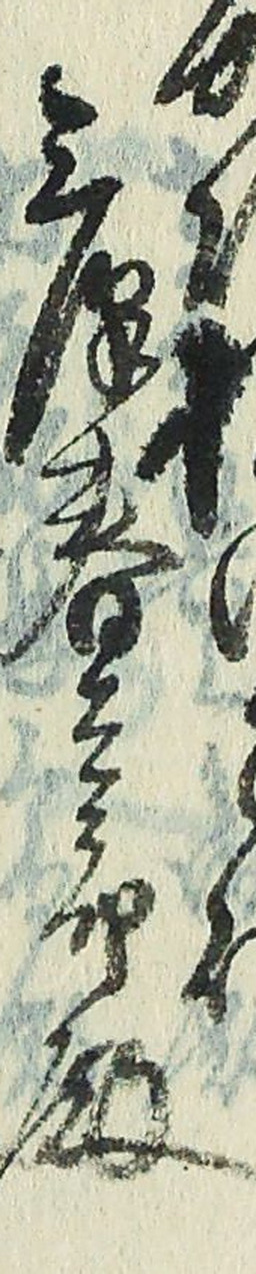三沢春太郎殿
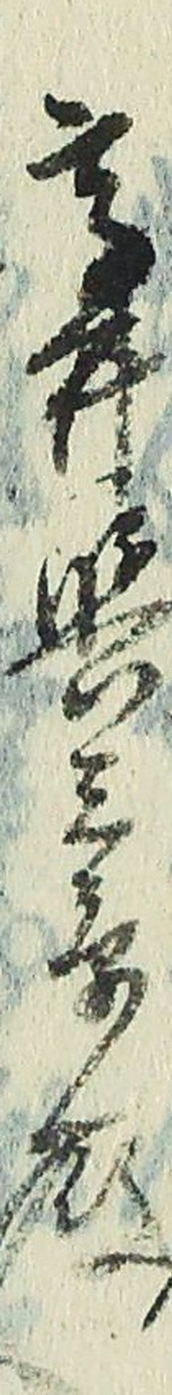高井与三兵衛殿
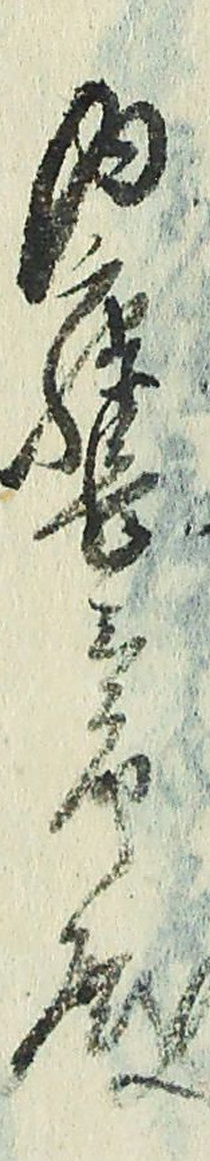内藤長三郎殿
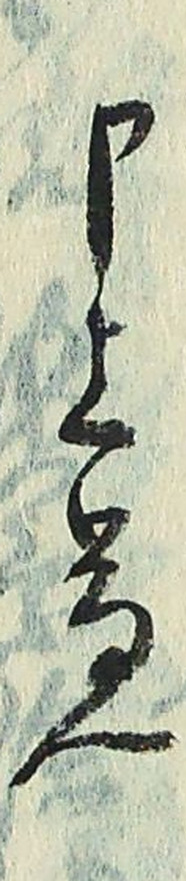申上覚
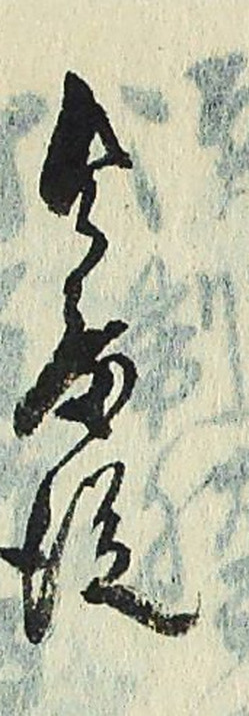今度従
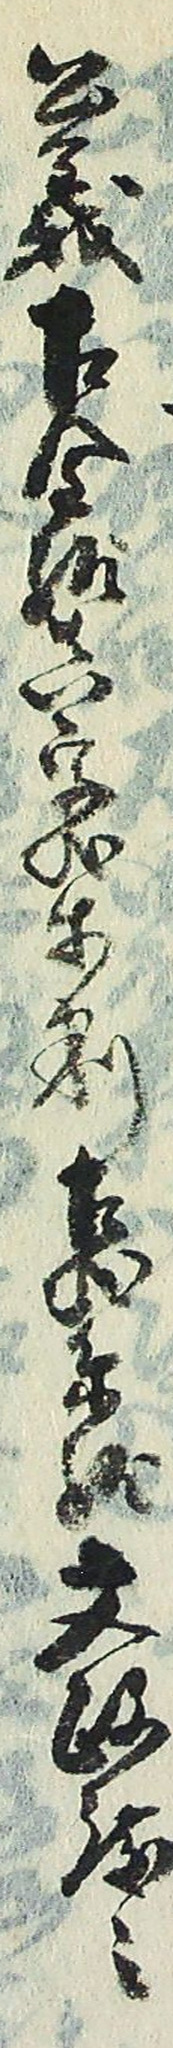公義古金銀真字弐歩判古弐朱銀文政度之
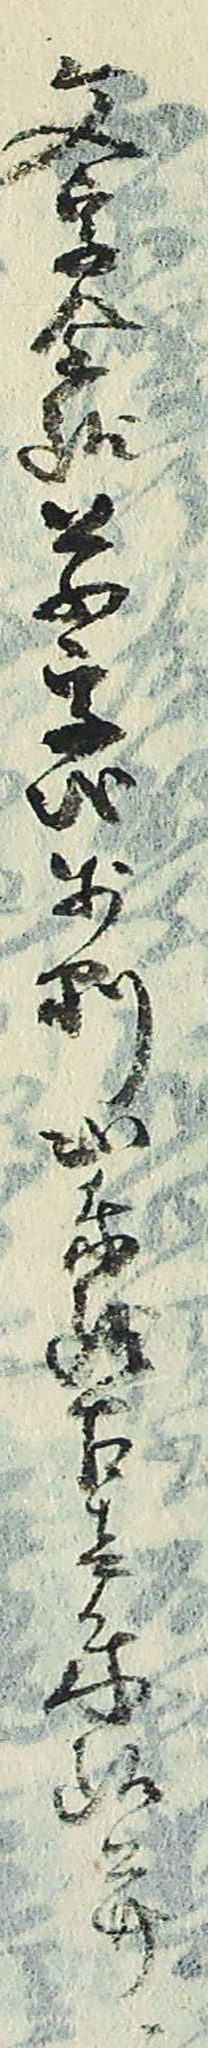文字金銀草字弐歩判弐朱銀古壱朱銀幷に
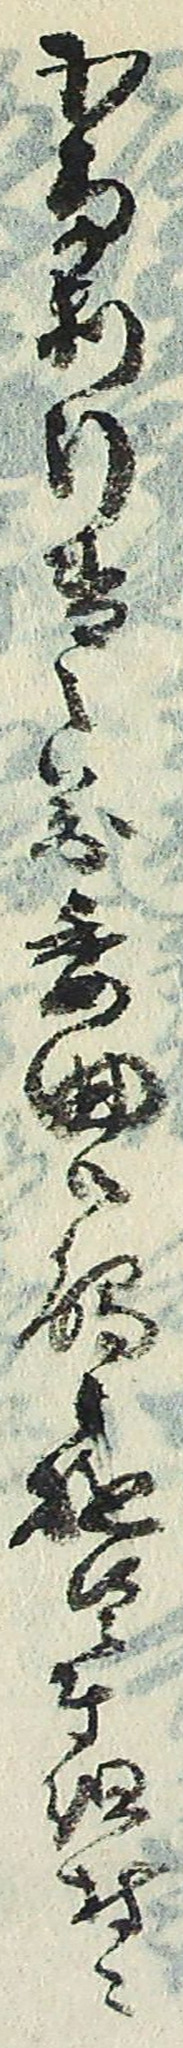五両判引替之義委曲御触被遊候に付組村々
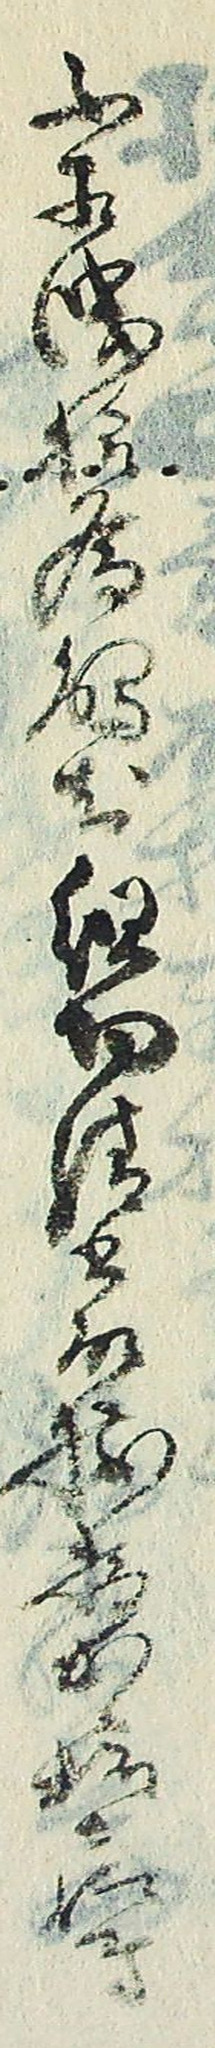不相洩様為触知組切請書取揃指出候様被仰付
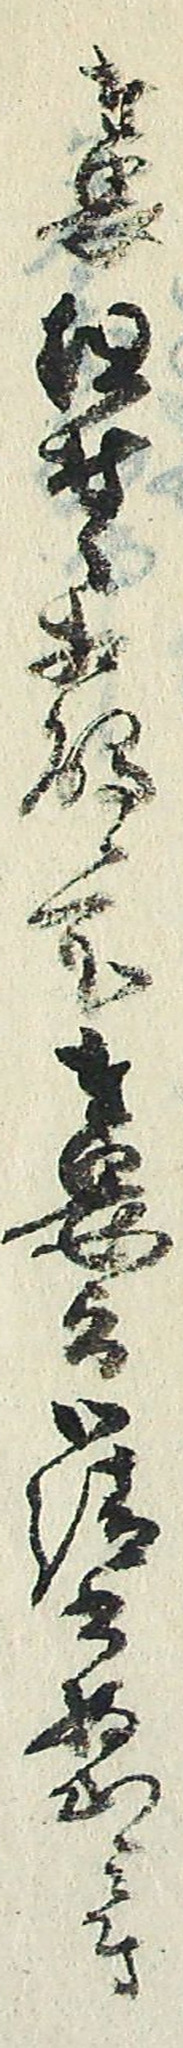奉畏組村々相触候所奉畏旨御請書指出申に付

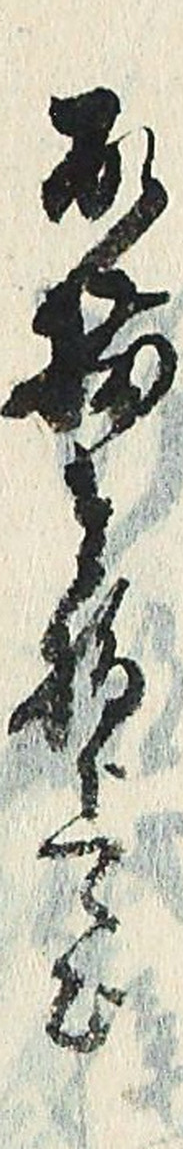取揃奉指上候以上
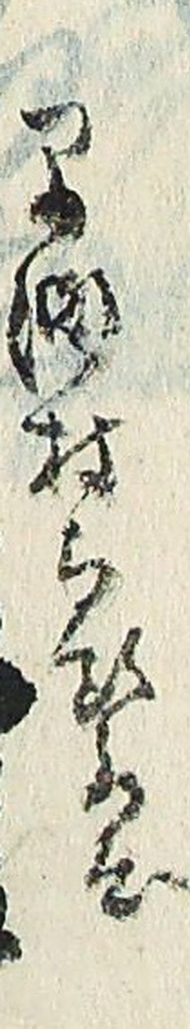早淵村与頭庄屋
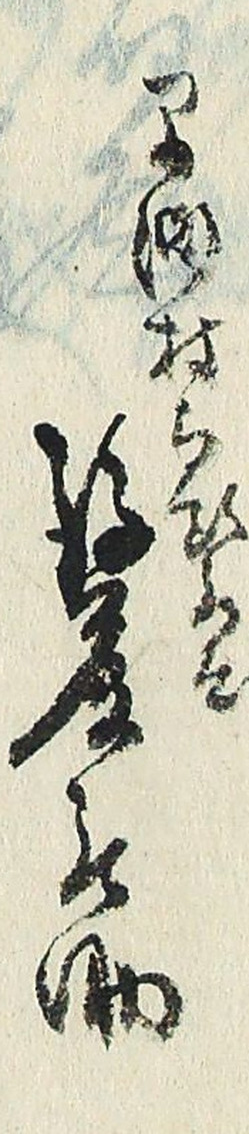後藤庄助
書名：諸御用御□受書控
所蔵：鳴門教育大学 Naruto University of Education
